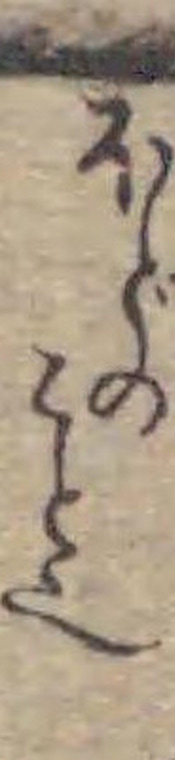ほどのこと也
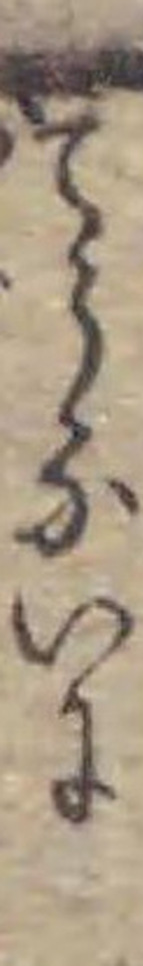てうないに
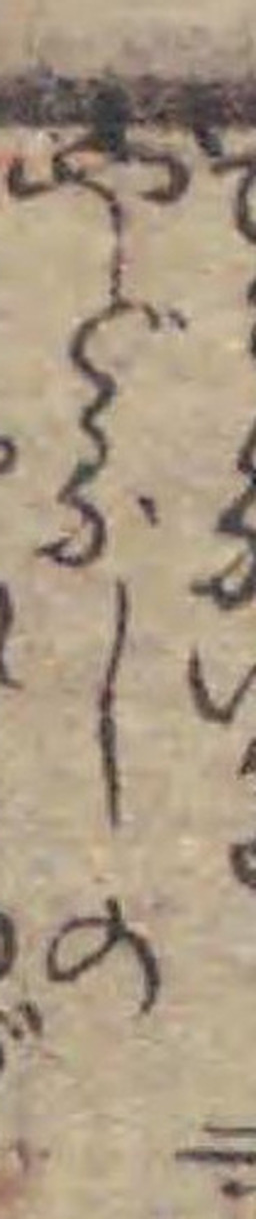やどなしの
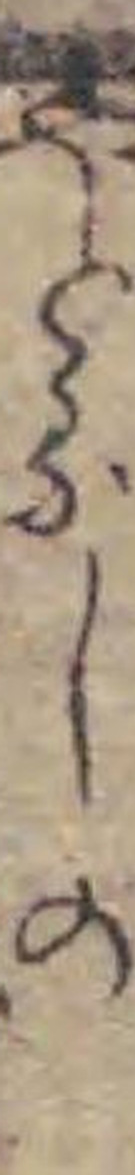やどなしの
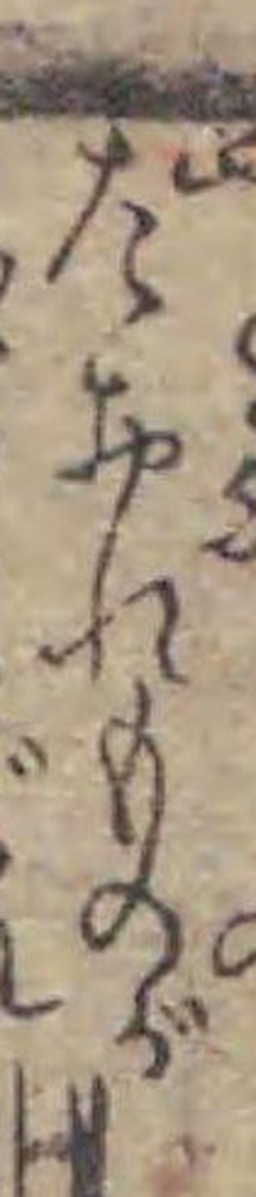たおれものが
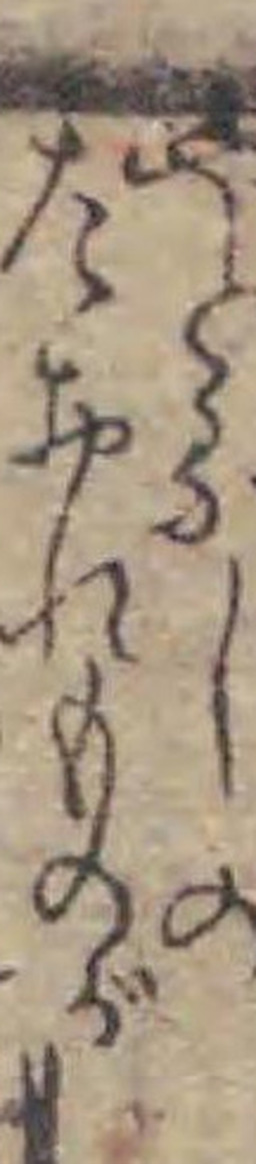たおれものが
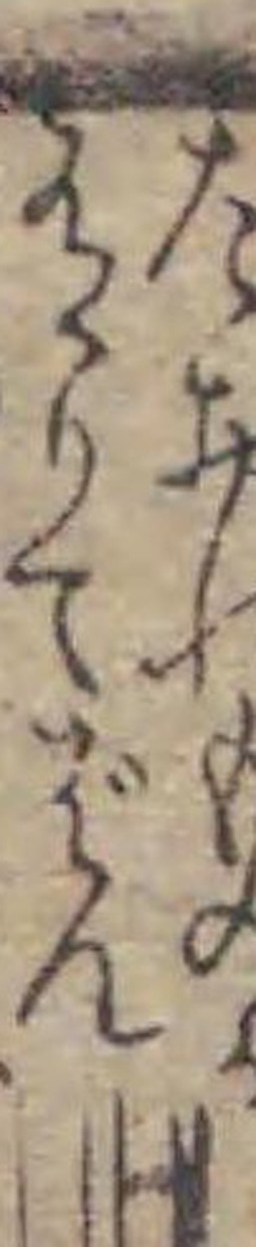有りてばん
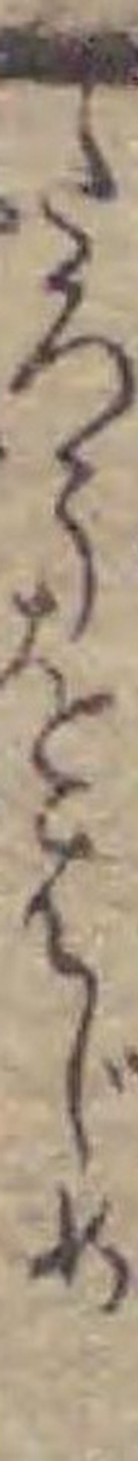たろうをはじめ
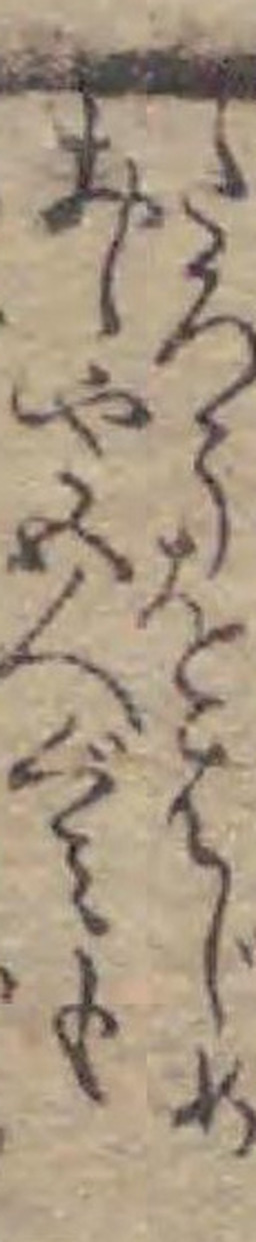おゝや五人ぐみも
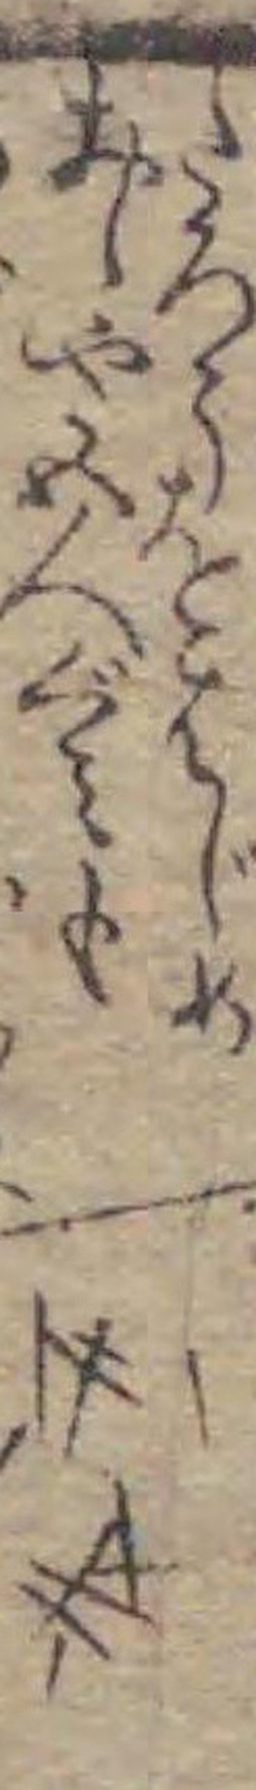おゝや五人ぐみも
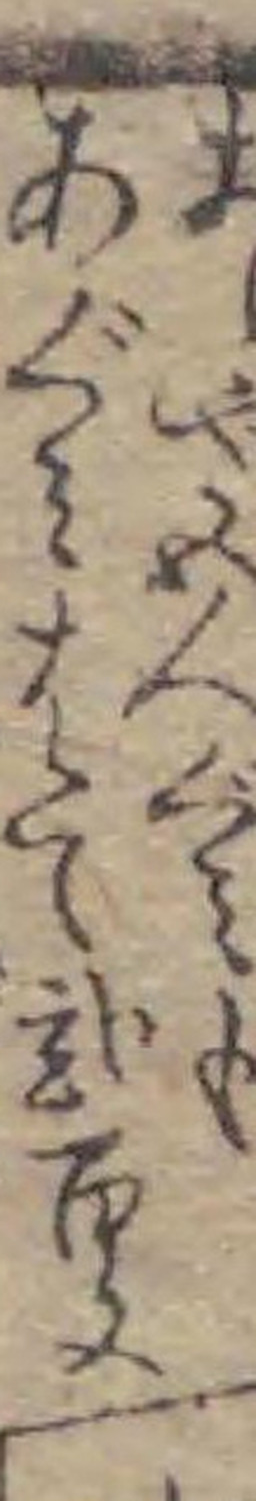あぐみはて二百文
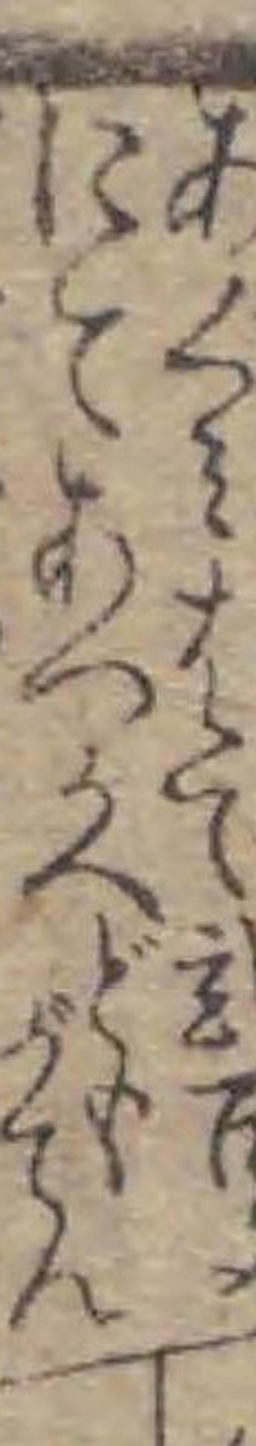にてあつかへどもがてん
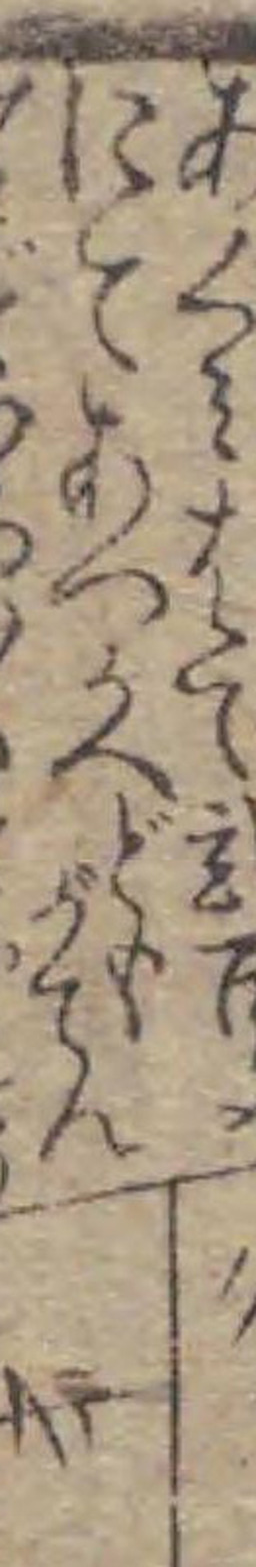にてあつかへどもがてん
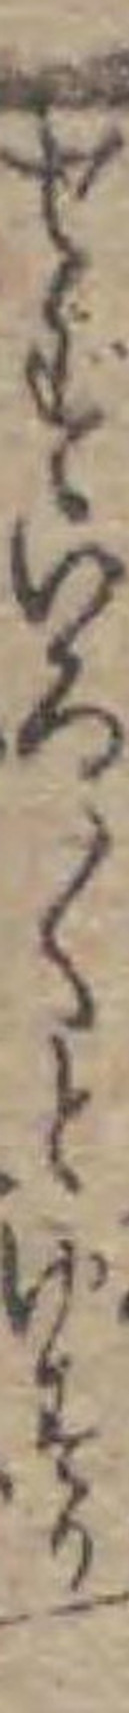せずいろ〳〵とゆすり
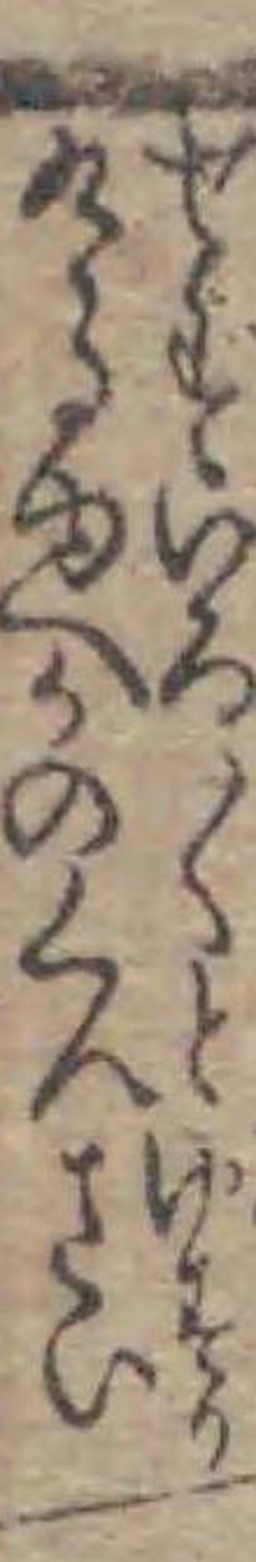けるゆへかのくんさい
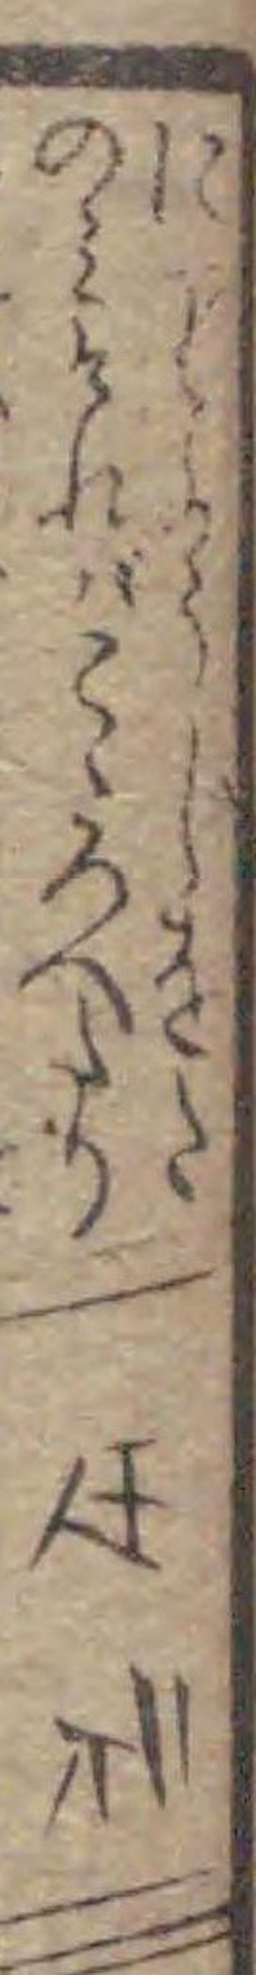のみければこゝろへたり
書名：江戸花俳優贔屓 : 3巻
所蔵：国立国会図書館 National Diet Library, JAPAN
